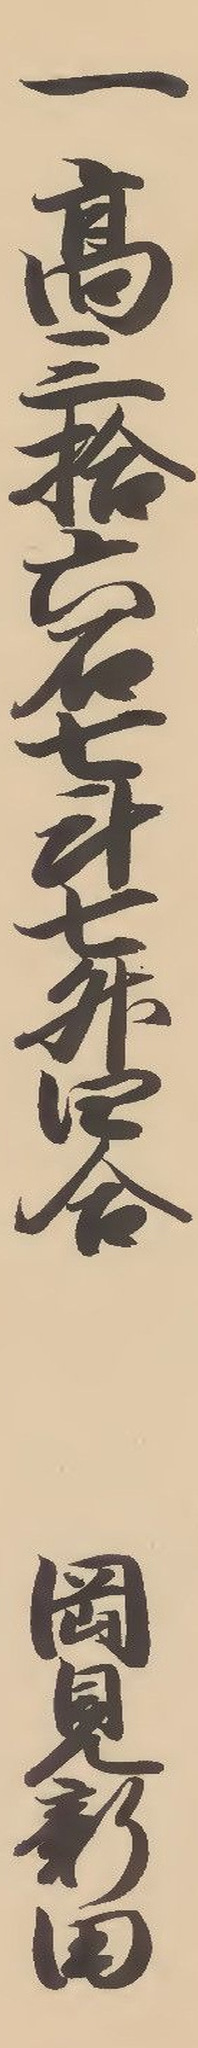一高三拾六石七斗七升四合岡見新田
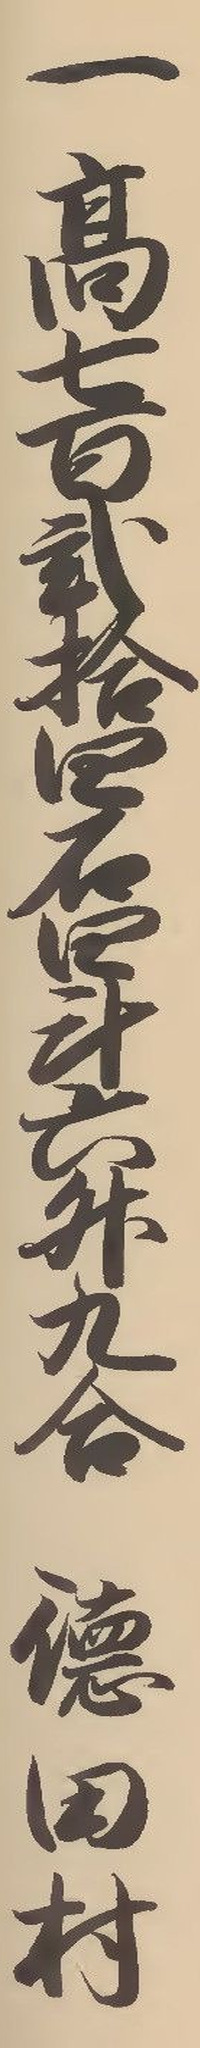一高七百弐拾四石四斗六升九合徳田村
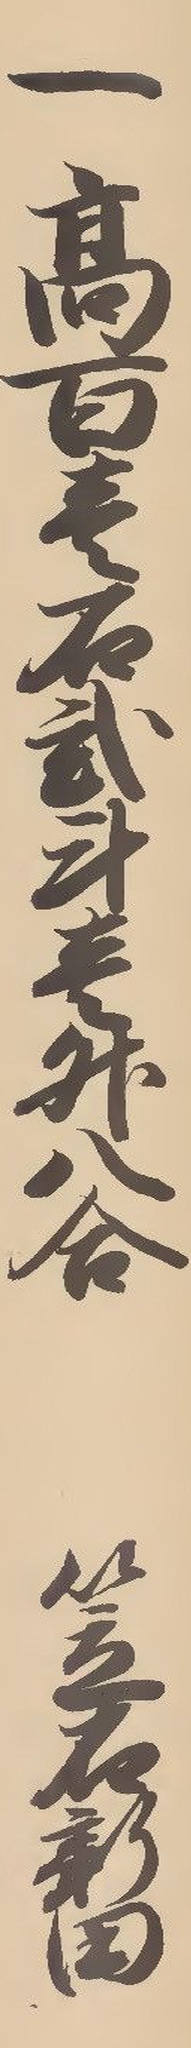一高百壱石弐斗壱升八合笠石新田
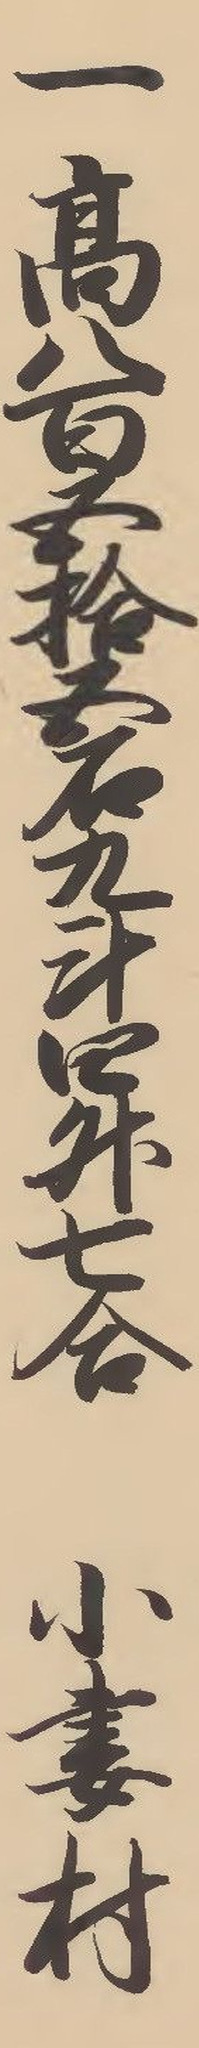一高八百五拾五石九斗四升七合小妻村
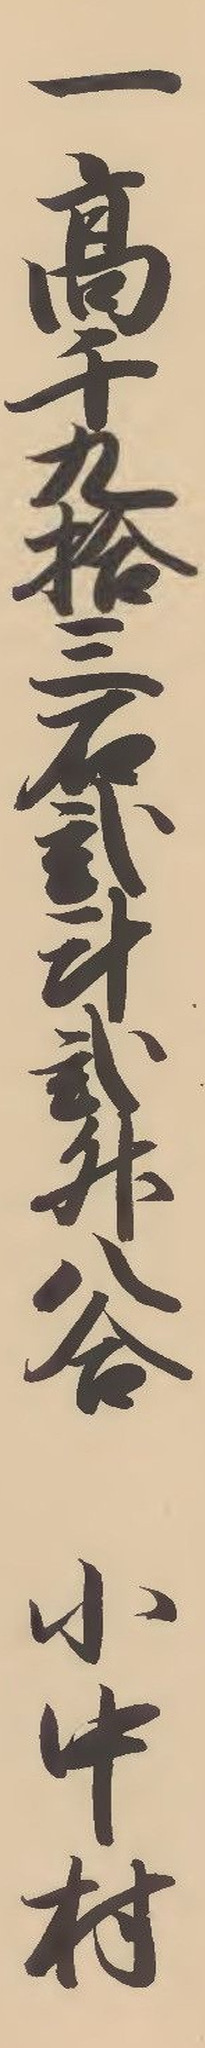一高千九拾三石弐斗弐升八合小中村
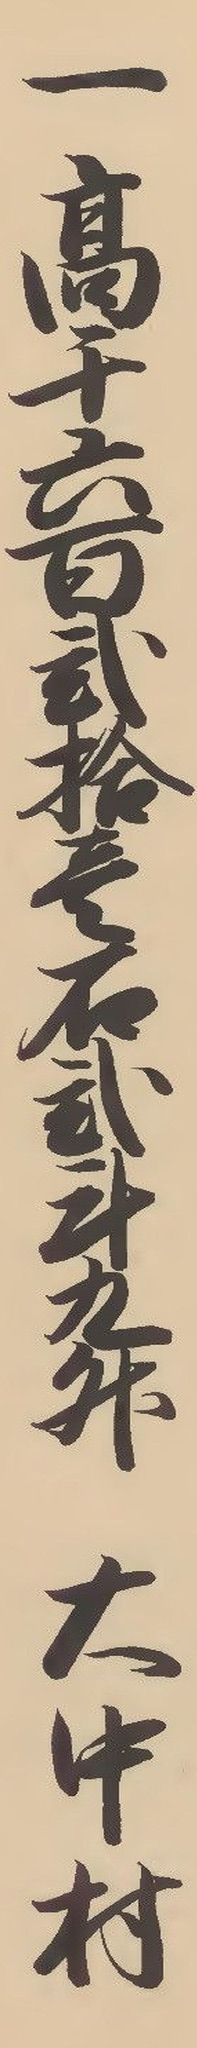一高千六百弐拾壱石弐斗九升大中村

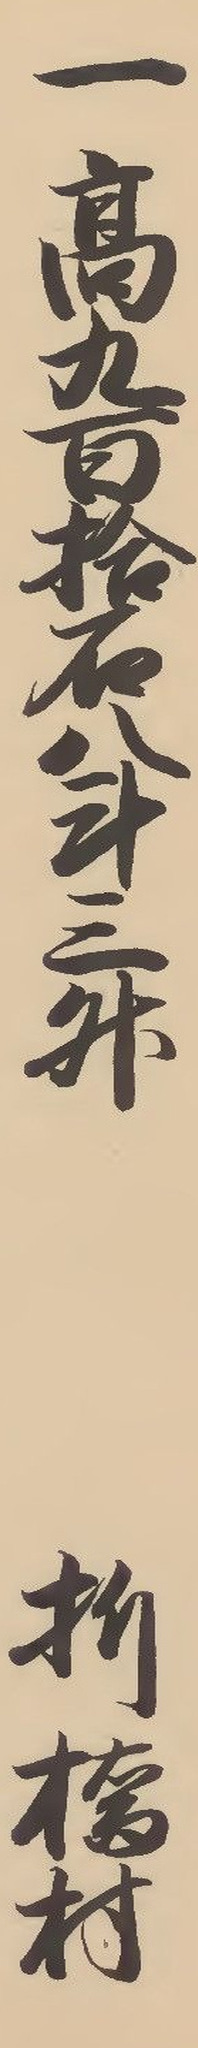一高九百拾石八斗三升折橋村
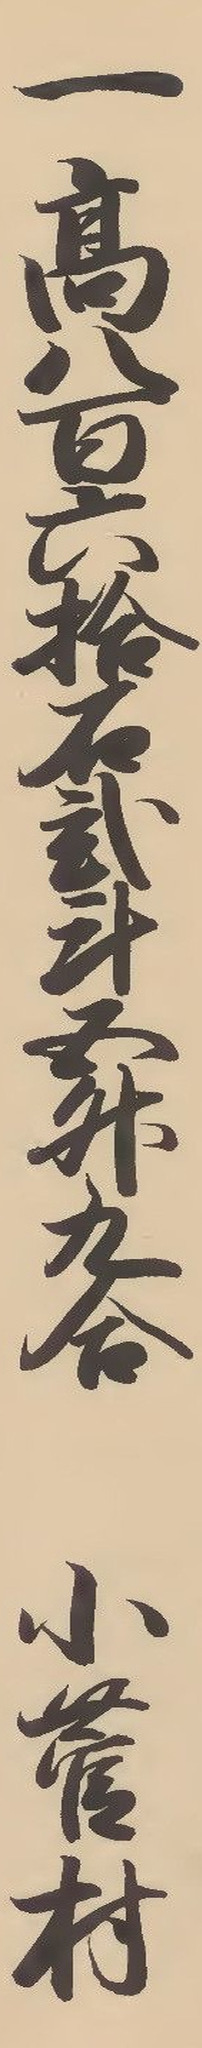一高八百六拾石弐斗五升九合小菅村
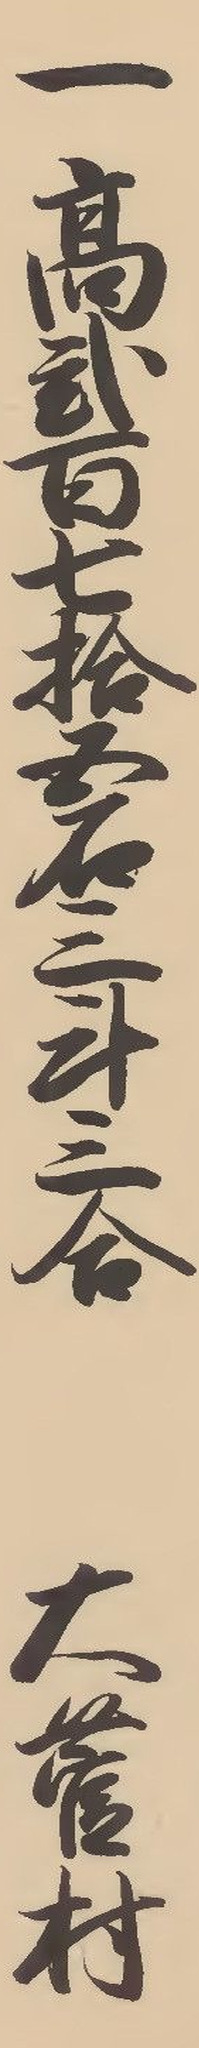一高弐百七拾五石三斗三合大菅村
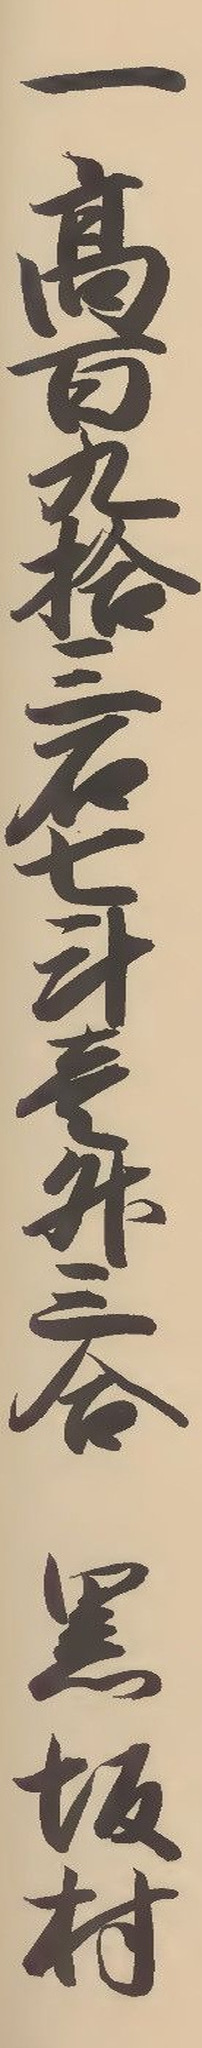一高百九拾三石七斗壱升三合黒坂村
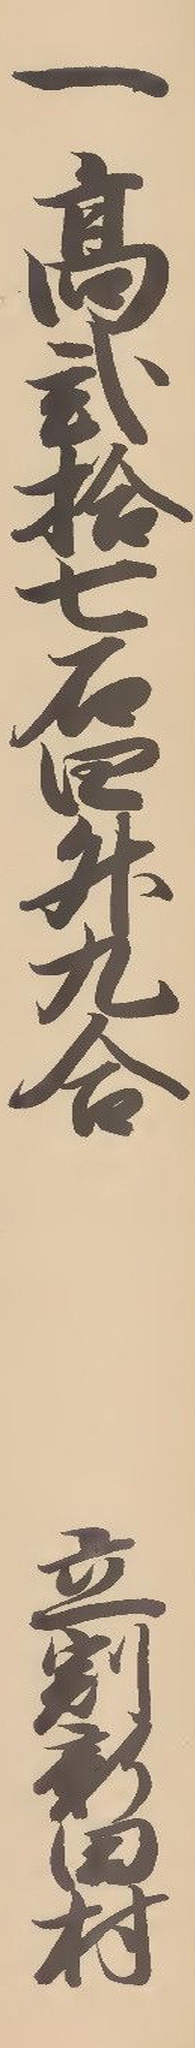一高弐拾七石四升九合立割新田村
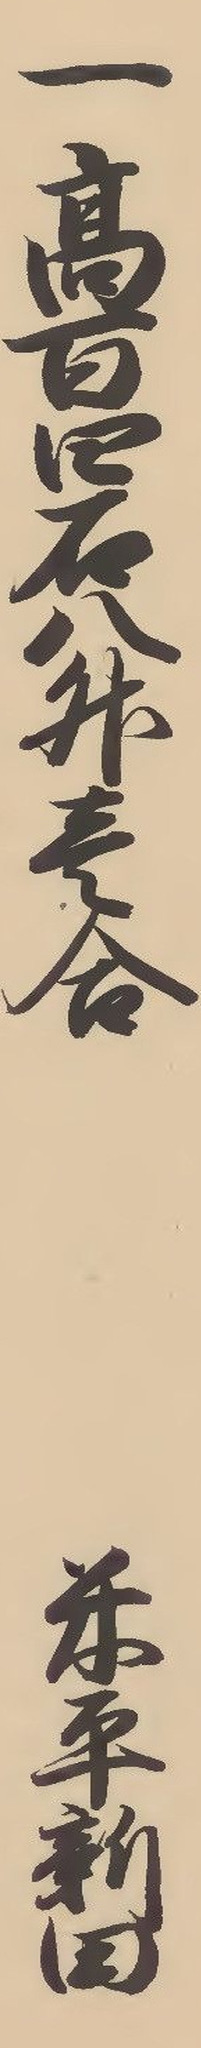一高百四石八升壱合米平新田
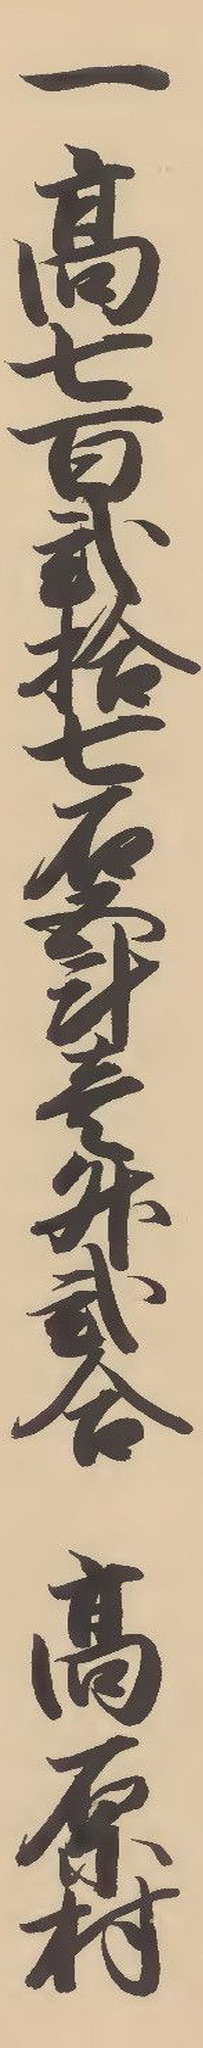一高七百弐拾七石五斗壱升弐合高原村
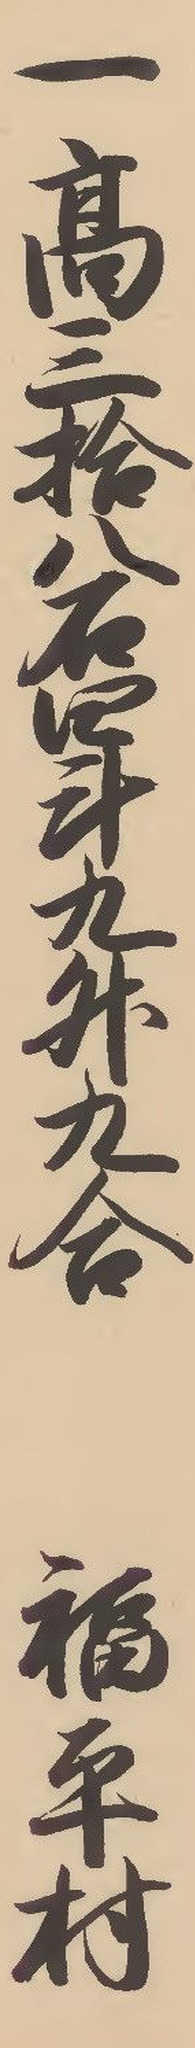一高三拾八石四斗九升九合福平村

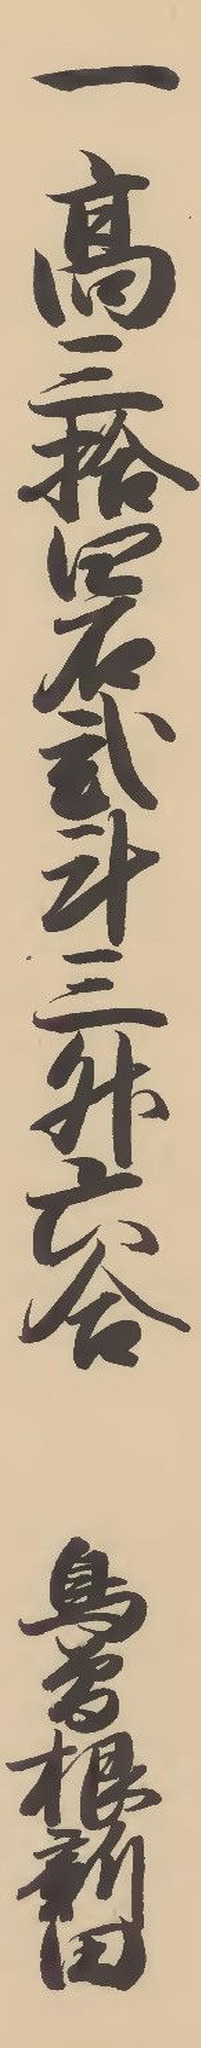一高三拾四石弐斗三升六合鳥曽根新田
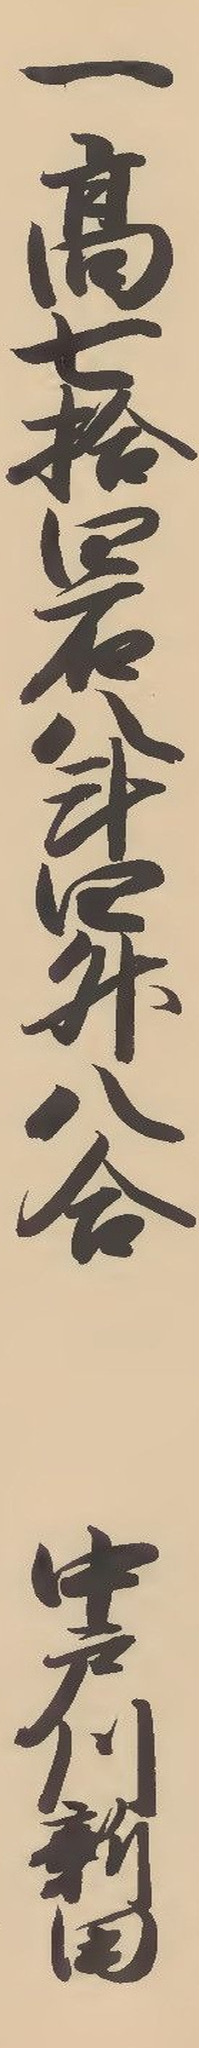一高七拾四石八斗四升八合中戸川新田
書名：常陸国郷帳
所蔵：国立公文書館 National Archives of Japan
